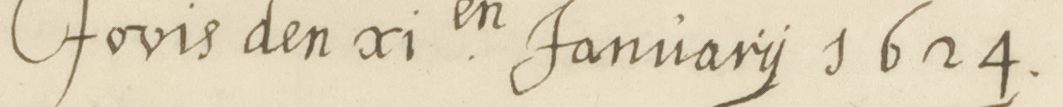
Jovis den xien. Januarij 1624.
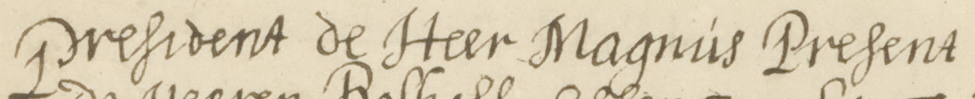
President de Heer Magnus Present
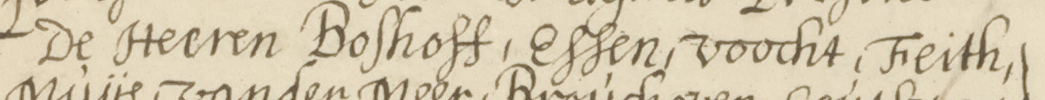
De Heeren Boshoff, Essen, voocht, Feith,
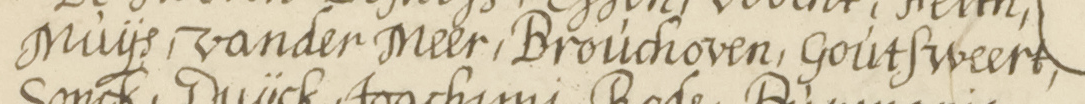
Muijs, vander Meer, Brouchoven, Goutsweert,
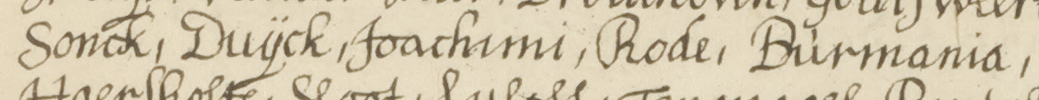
Sonck, Duijck, Joachimi, Rode, Burmania,
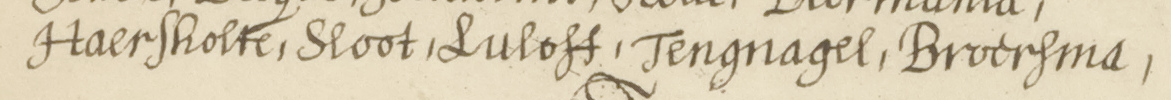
Haersholte, Sloot, Luloff, Tengnagel, Broersma,
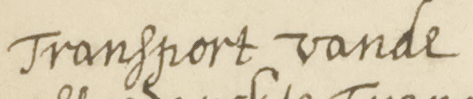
Transport vande
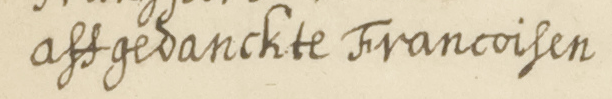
affgedanckte Francoisen
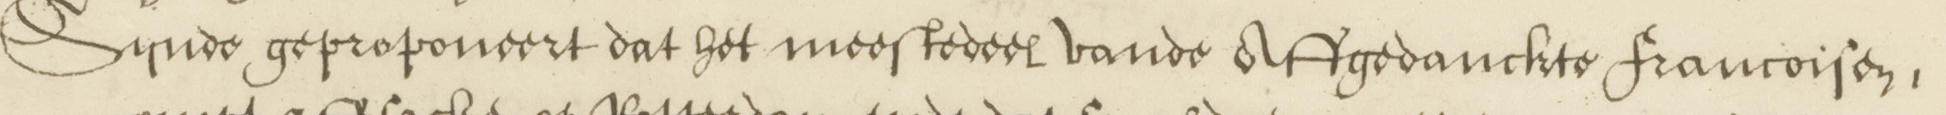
Synde geproponeert dat het meestedeel vande Affgedanckte francoisen,
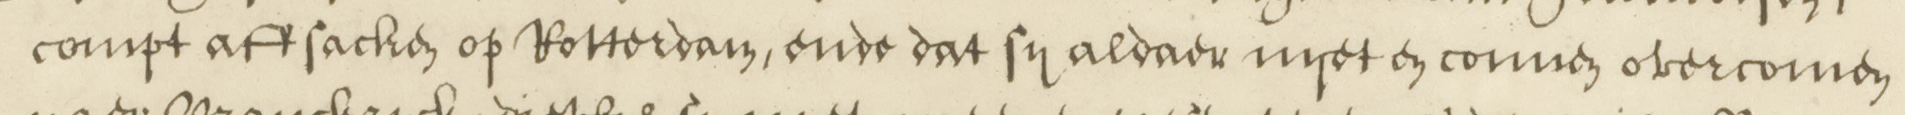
compt affsacken op Rotterdam, ende dat sy aldaer nyet en connen overcomen
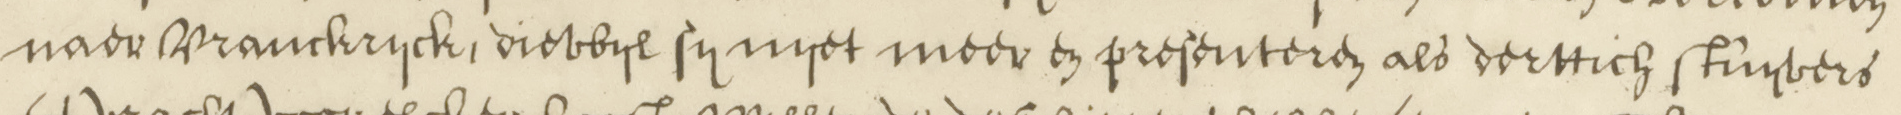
naer Vranckryck, diewyl sy nyet meer en presenteren als derttich stuyvers
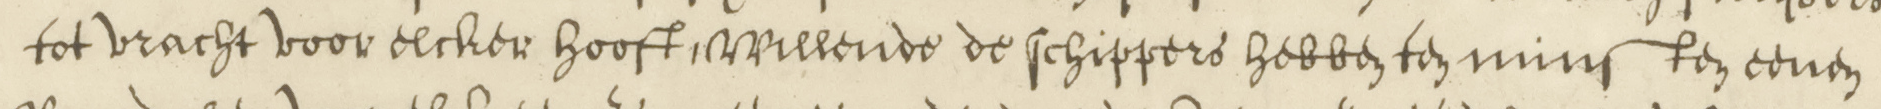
tot vracht voor elcker hooft, Willende de schippers hebben ten minsten eenen
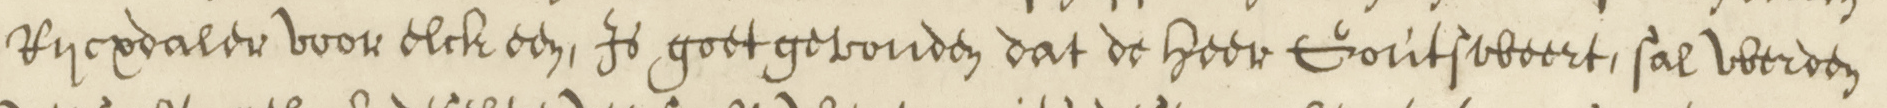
Rijcxdaler voor elck een, Is goetgevonden dat de heer Goutsweert, sal werden
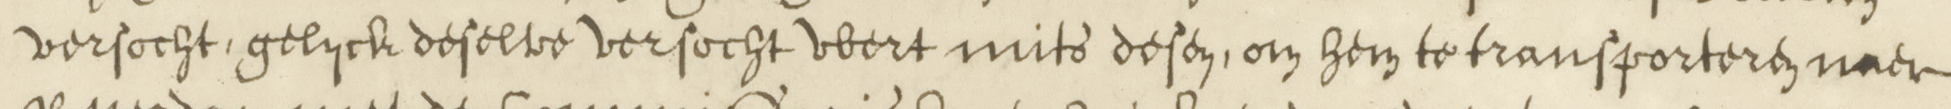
versocht, gelyck deselve versocht wert mits desen, om hem te transporteren naer
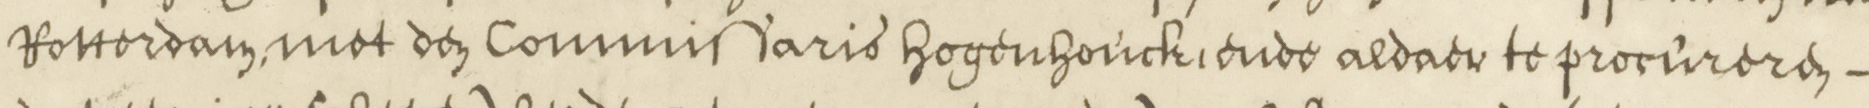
Rotterdam met den Commissaris hogenhouck, ende aldaer te procureren —
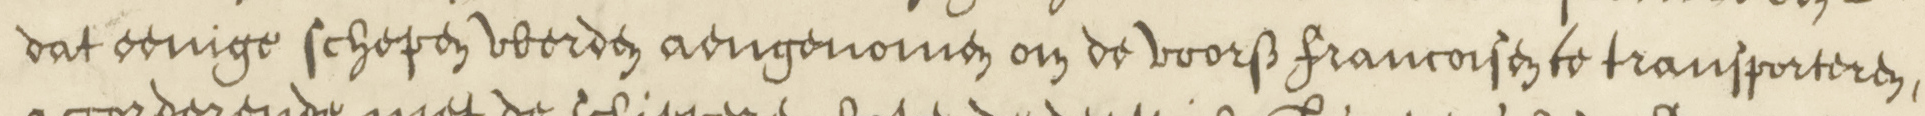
dat eenige schepen werden aengenomen om de voors francoisen te transporteren,
